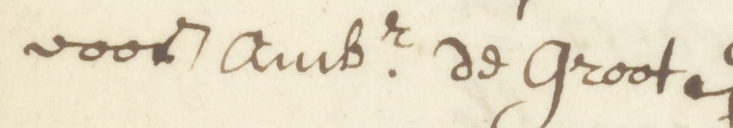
voor Ambr. de Groot
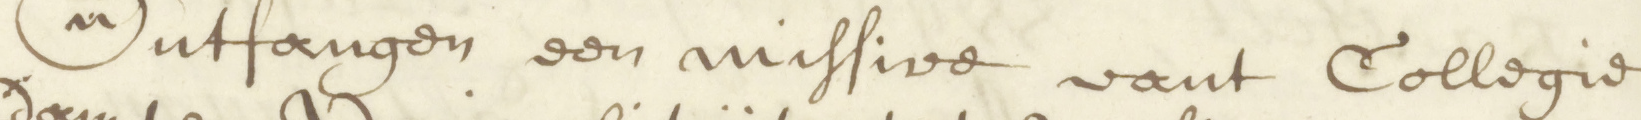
Ontfangen een missive vant Collegie
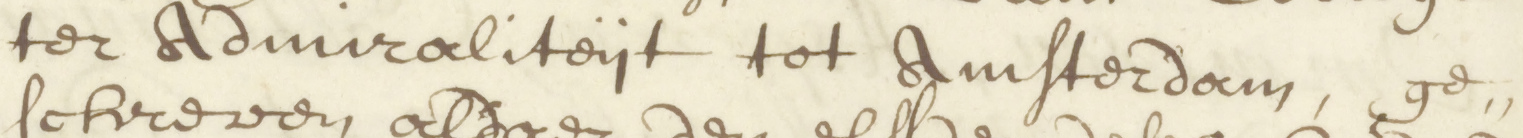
ter Admiraliteijt tot Amsterdam, ge„
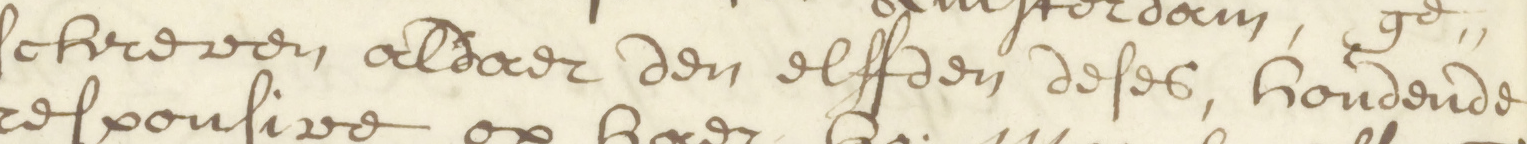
schreven aldaer den elffden deses, houdende
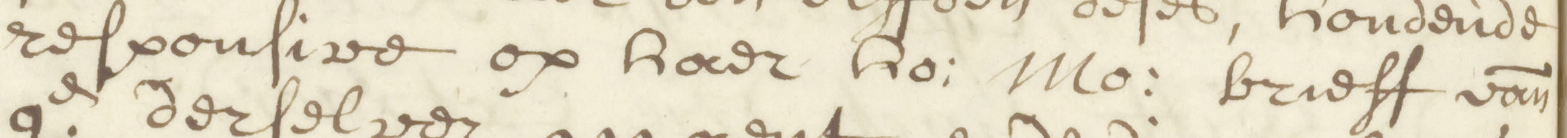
responsive op haer Ho:Mo: brieff van
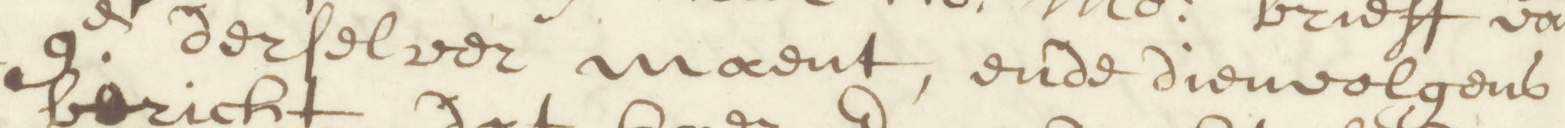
9en. derselver maent, ende dienvolgens
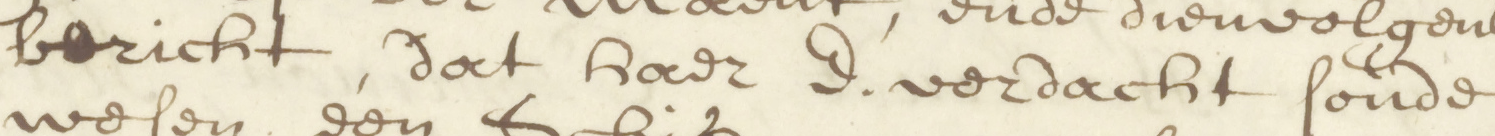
bericht, dat haer E. verdacht soude
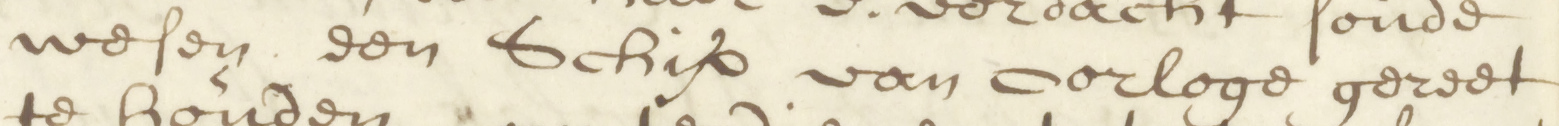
wesen, den Schip van Oorloge gereet
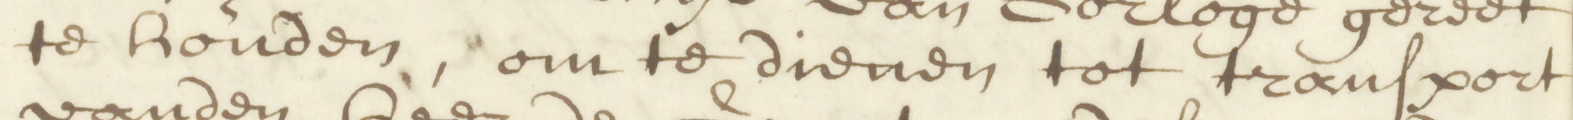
te houden, om te dienen tot transport
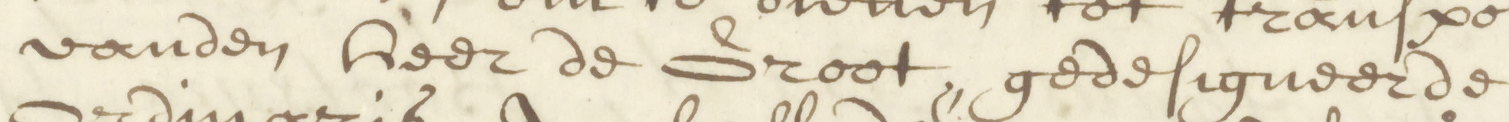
vanden heer de Groot, gedesigneerde
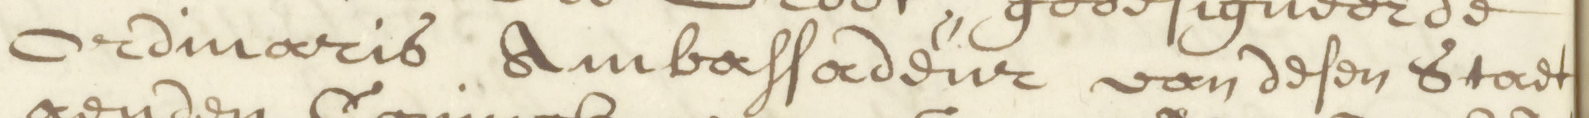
Ordinaris Ambassadeur van desen Staet
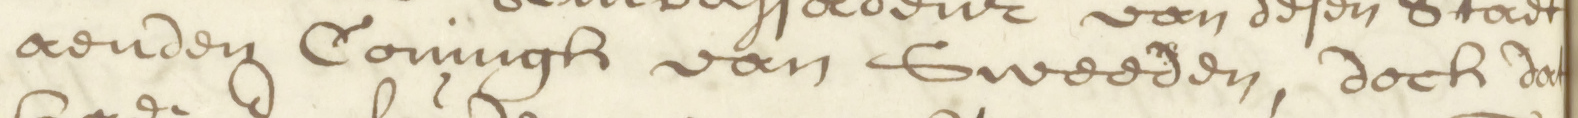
aenden Coningh van Sweeden, doch dat
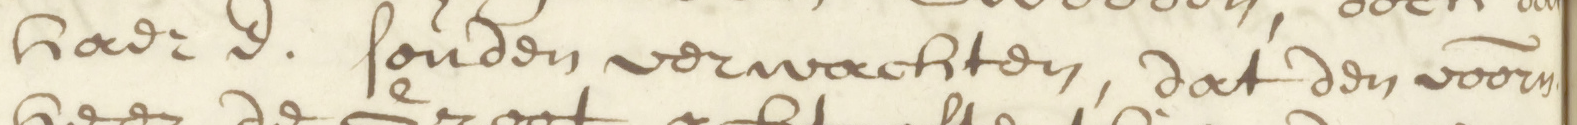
haer E. souden verwachten, dat den voorn
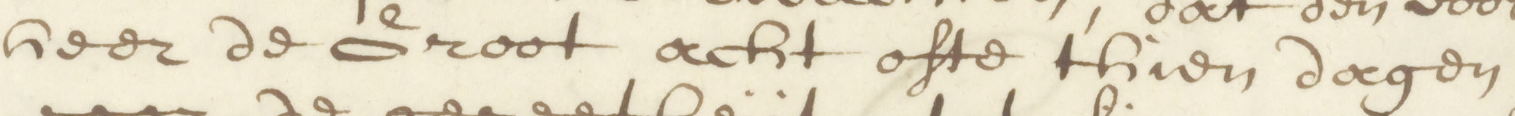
heer de Groot acht ofte thien dagen
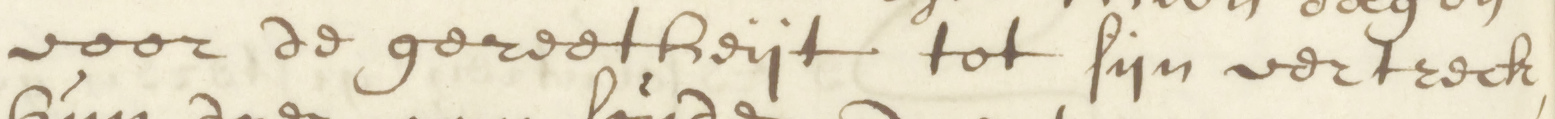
voor de gereetheijt tot sijn vertreck,
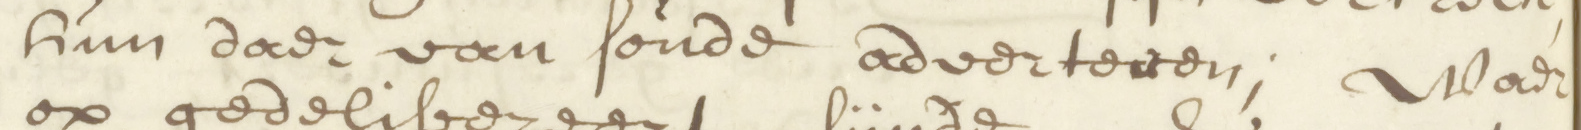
hun daer van soude adverteren; Waer
